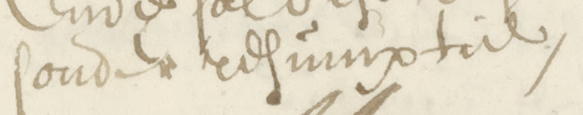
sonder resumptie.
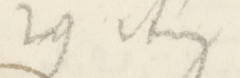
29 Aug.
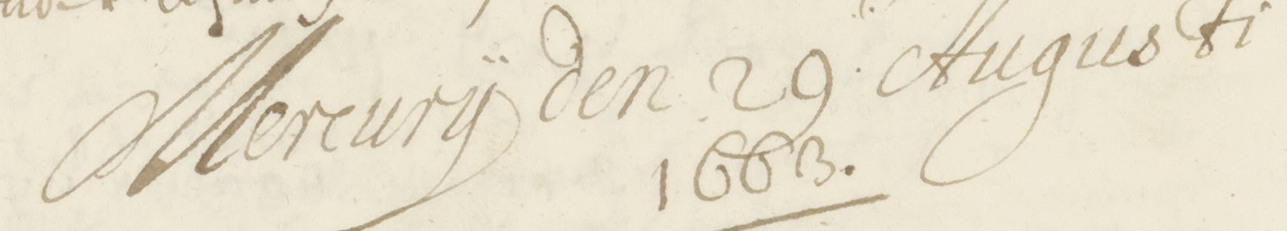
Mercurij den 29en Augusti
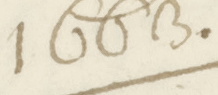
1663.
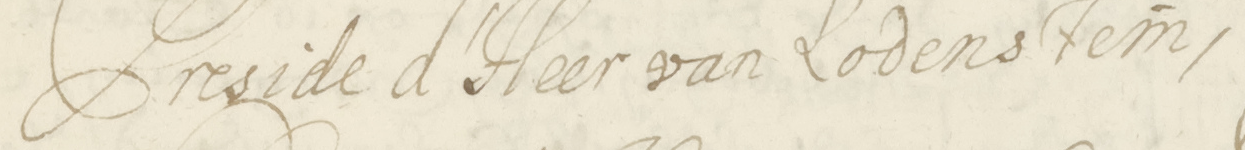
Preside d'Heer van Lodenstein.
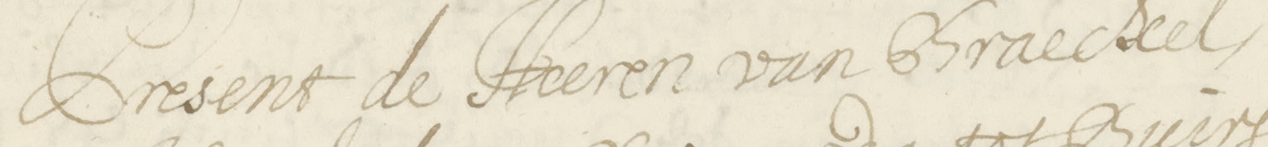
Present de Heeren van Braeckel,
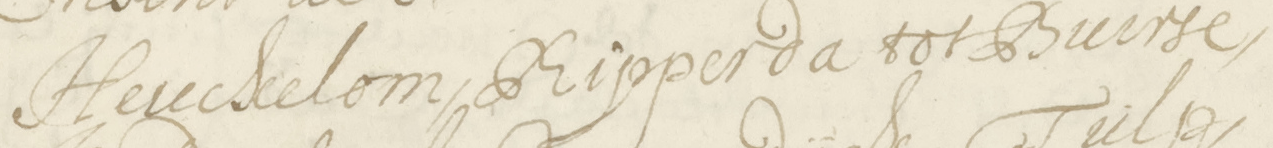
Heuckelom, Ripperda tot Buirse,
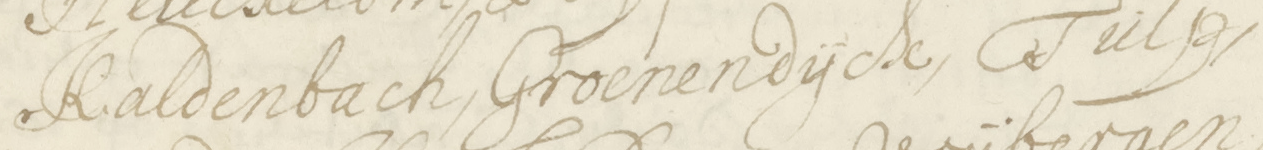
Kaldenbach, Groenendijck, Tulp,
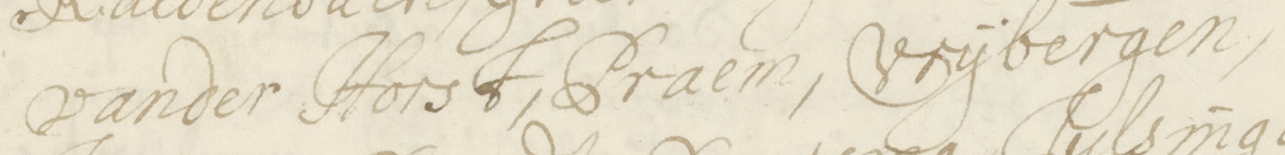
vander Horst, Praem, Vrijbergen,
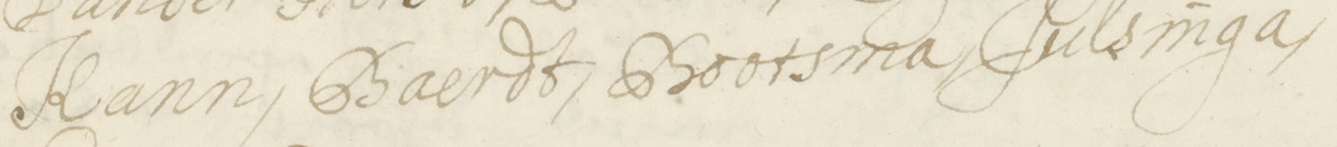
Kann, Baerdt, Bootsma, Julsinga,
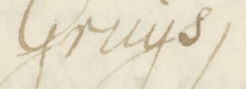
Gruijs.
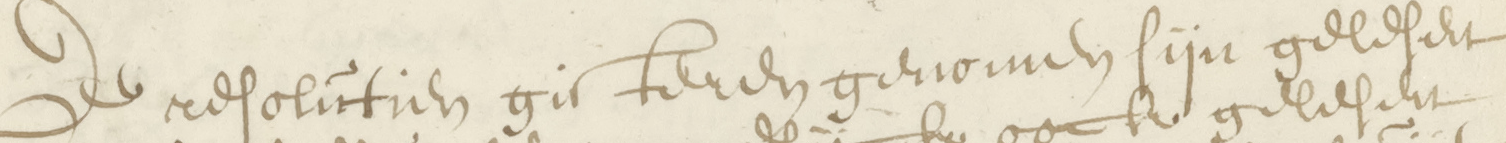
De resolutien gisteren genomen sijn gelesen
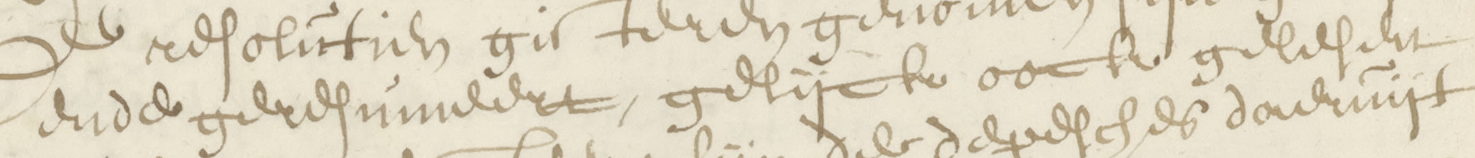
ende geresumeert, gelijck oock gelesen
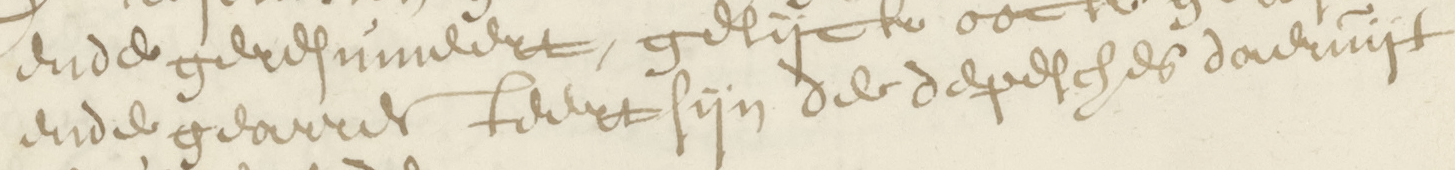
ende gearresteert sijn de depesches daeruijt
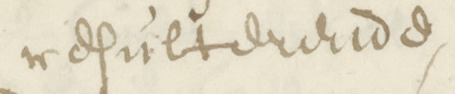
resulterende.
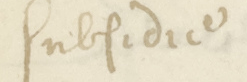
Subsidie
